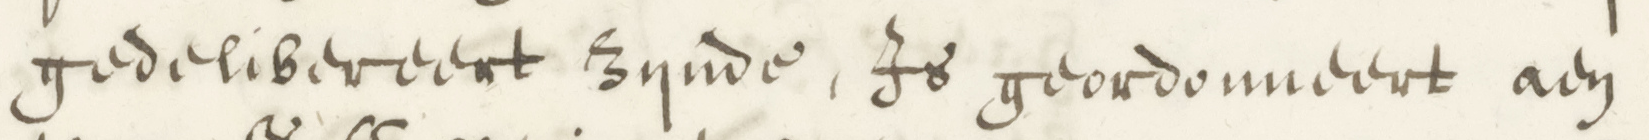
gedelibereert zynde, Is geordonneert aen
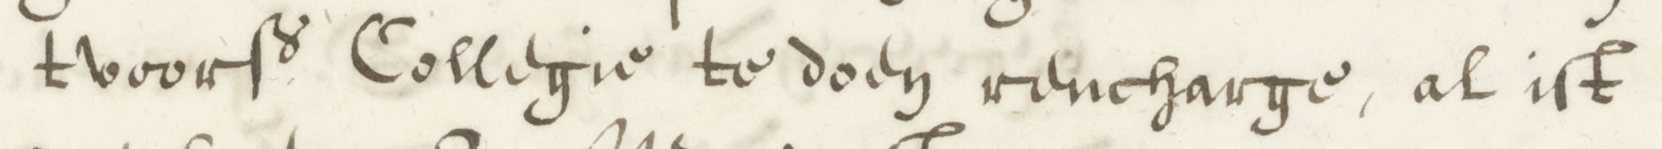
tvoors. Collegie te doen rencharge, al ist
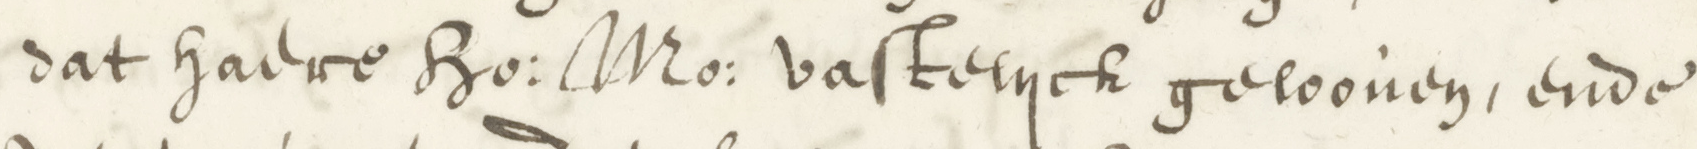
dat haere Ho:Mo: vastelyck geloouen, ende
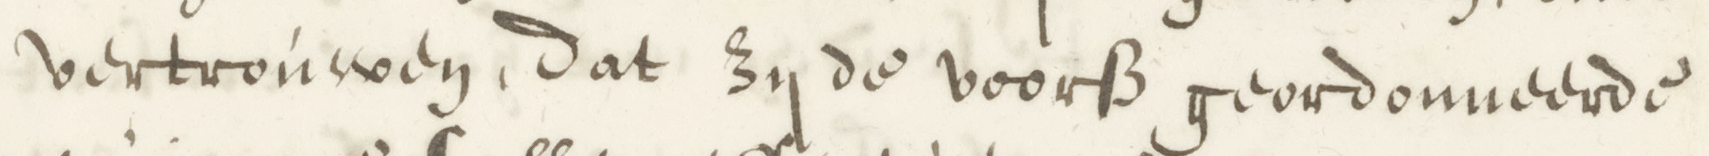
vertrouwen, dat zy de voors geordonneerde
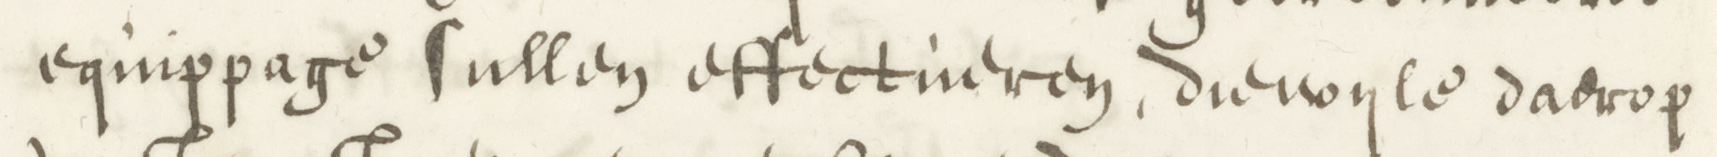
equippage sullen effectueren, diewyle daerop
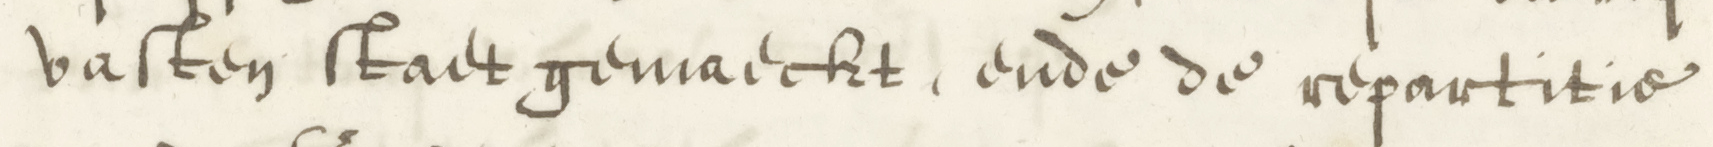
vasten staet gemaeckt, ende de repartitie
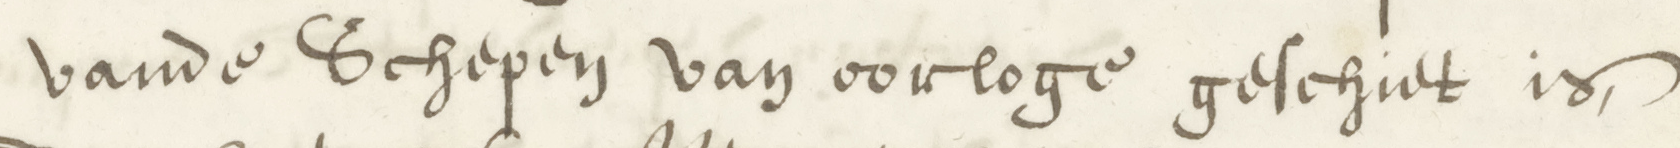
vande Schepen van oorloge geschiet is,
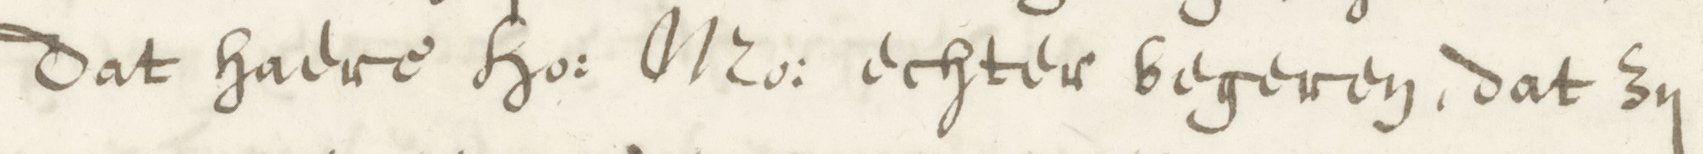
dat haere Ho:Mo: echter begeren, dat zy
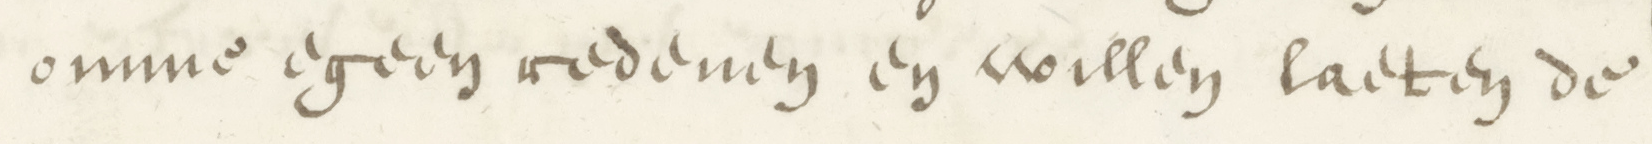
omme egeen redenen en willen laeten de
